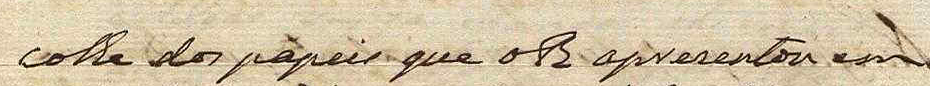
colhe dos papeis que o R aprezentou em
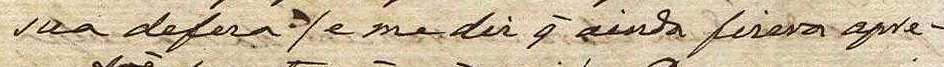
sua defeza / e me diz q̄ ainda fizera apre
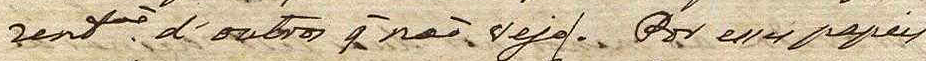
zent.aõ d'outros q̄ naõ vejo/. Por esses papeis
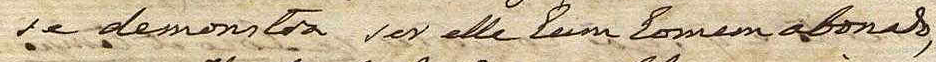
se demonstra ser elle hum homem abonado,
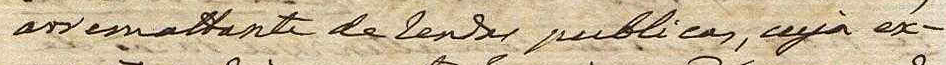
arremattante de Rendas publicas, cuja ex
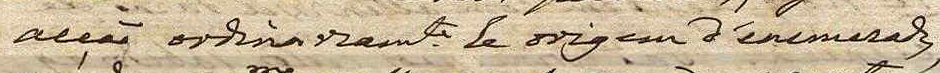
acçaõ ordinariam.te he origem d'enemezades,
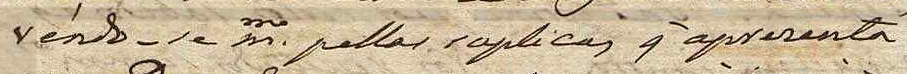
vendo-se m.mo pellas suplicas q̄ aprezenta
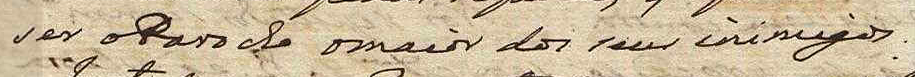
ser o Parocho o maior dos seus inimigos.
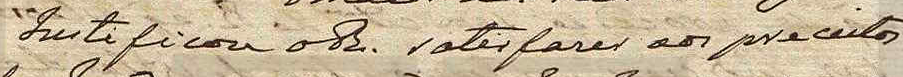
Iustificou o R. satisfazer aos preceitos
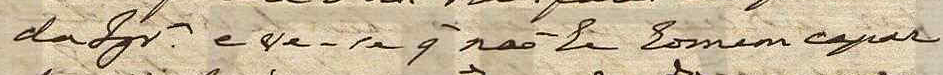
da Igr.a e ve-se q̄ naõ he homem capaz
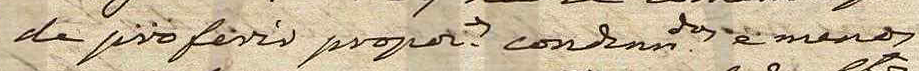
de proferir propoz.es condenn.dos e menos
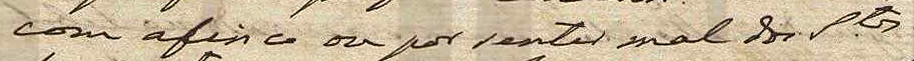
com afinco ou por sentir mal dos S.tos
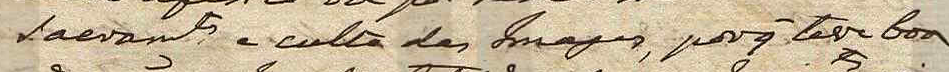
sacram.tos e culto das Images, porq̄ teve boa
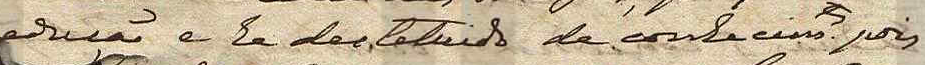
adeçaõ e he destetuido de conhecim.to pois
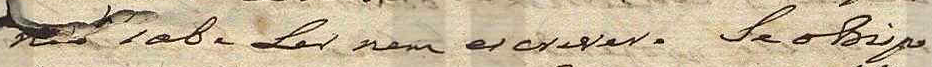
naõ sabe Ler nem escrever. Se o Bispo
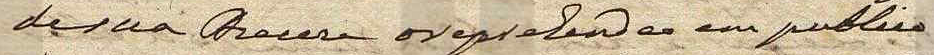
de sua Dioceze o reprehendeo em publico
